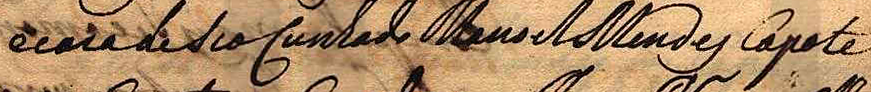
e caza de seo Cunhado Manoel Mendes Capote
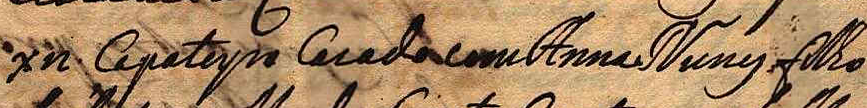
xn Çapateyro Cazado com Anna Nunes filho
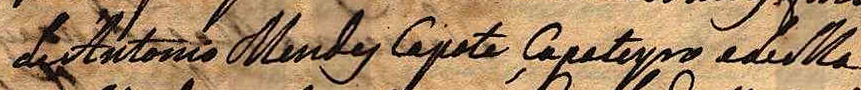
de Antonio Mendes Capote Çapateyro, e de Ma
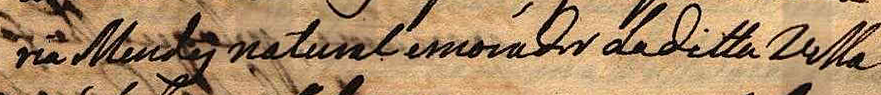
ria Mendes natural e morador da ditta Villa
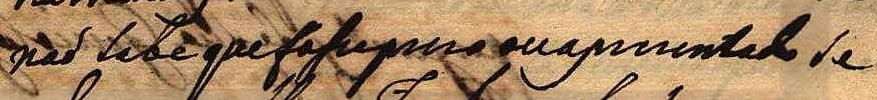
naõ sabe que fosse prezo, ou aprezentado se
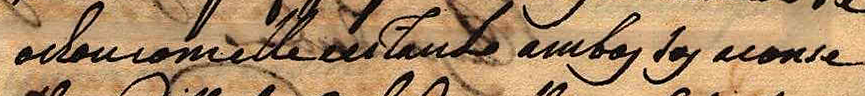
achou com elle, e estando ambos sos aconse
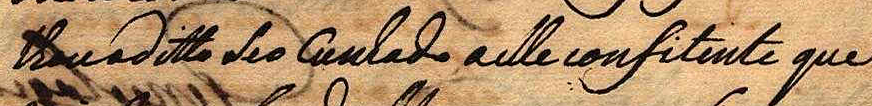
lhou o ditto seo Cunhado a elle confitente que
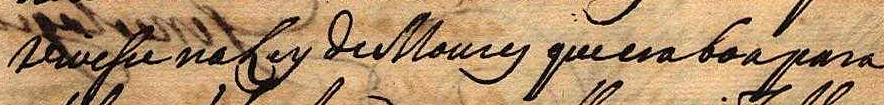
vivesse na Ley de Mouzes que era boa para
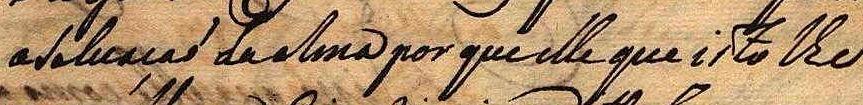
a saluaçaõ da alma porque elle que isto lhe
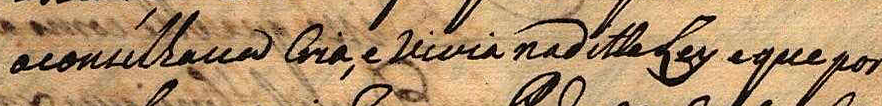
aconselhaua Cria, e vivia na ditta Ley e que por
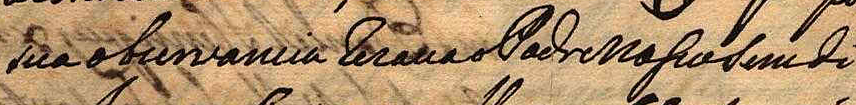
sua observancia Rezaua o Padre nosso sem di
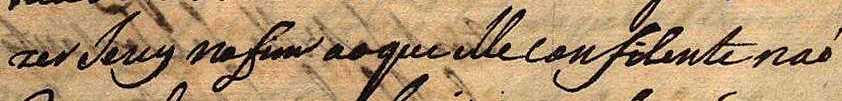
zer Iesus no fim ao que elle confitente naõ
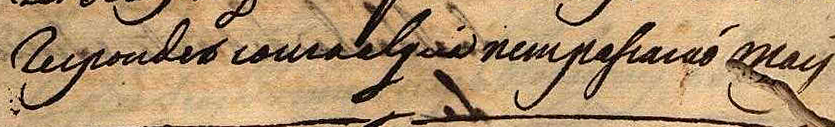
Respondo couza alguā nem passaraõ mais
